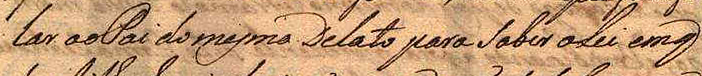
lar ao Pai do mesmo Delato para saber a Lei em q̄
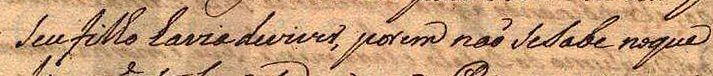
seu filho havia de viver, porem naõ se sabe no que
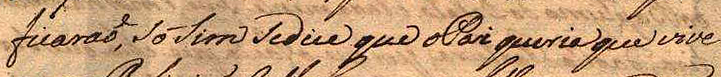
ficaraõ, só sim se dice que o Pai queria que vive
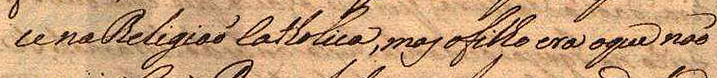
ce na Religiaõ Catholica, mas o filho era o que naõ
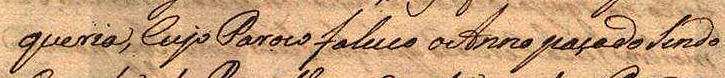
queria, Cujo Paroco faleceo o Anno paçado Sendo
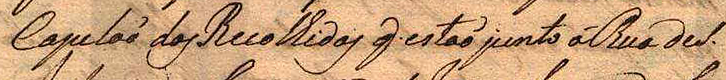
Capelaõ das Recolhidas q̄ estaõ junto á Rua de S.
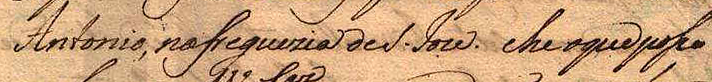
Antonio, na freguezia de S. Ioze. e he o que posso
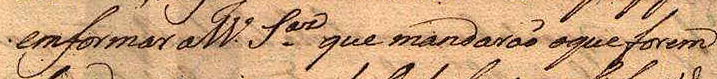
emformar a VV. S.as que mandaraõ o que forem
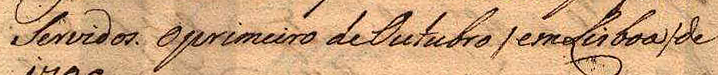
Servidos. o primeiro de Outubro / em Lisboa/ de
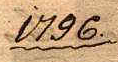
1796.
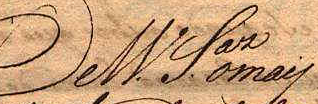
De VV. S.as o mais
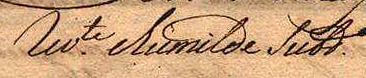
Rev.te e humilde Subd.o
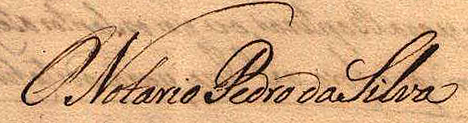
O Notario Pedro da Silva
